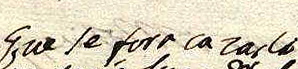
Que se fora cazado
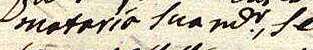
mataría sua m.er, se
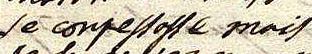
se confessasse mais
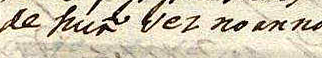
de huā vez no anno.
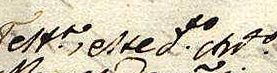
Test.a, este d.to Anto.
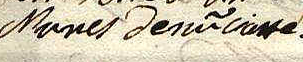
Nunes denūciante.
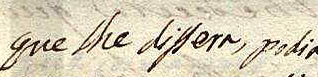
que lhe dissera, podia
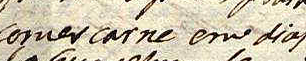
comer carne em dias
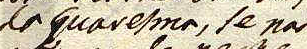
da Quaresma, se naõ
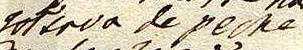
gostava de peche:
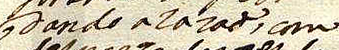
dando a Razaõ, com
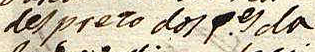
desprezo dos P.es da
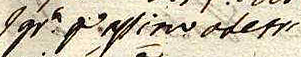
Jgr.a q̄ assim o detri
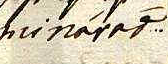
mináraõ.
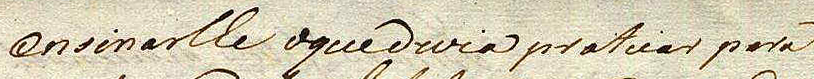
ensinandolhe o que devia praticar para
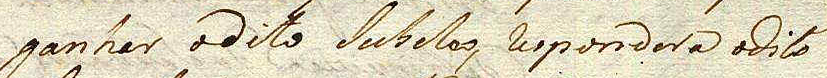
ganhar o dito Iubeleo, Respondera o dito
